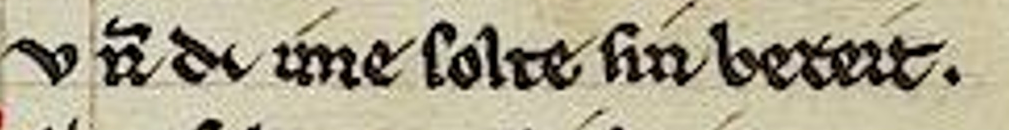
Vn(d) d(az) ime ſolte ſin bereit.
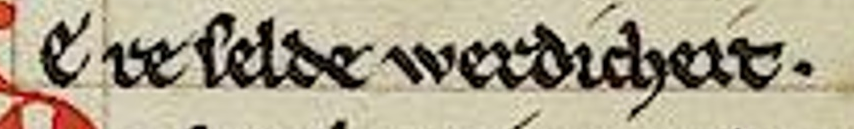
Ere ſelde werdicheit.
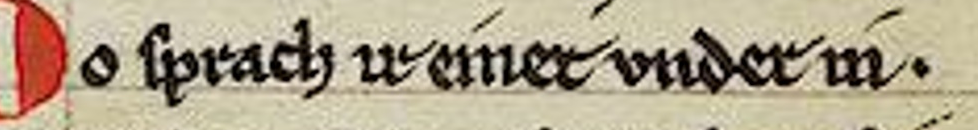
*Do ſprach ir einer vnder in.
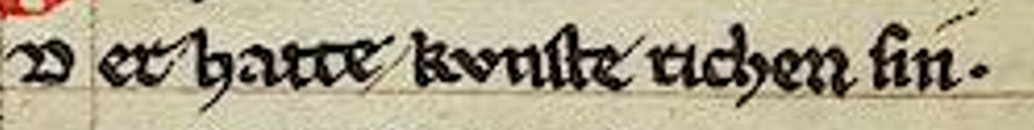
Der hatte kvnſte richen ſin.
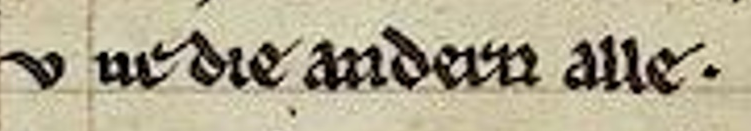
Vur die andern alle.
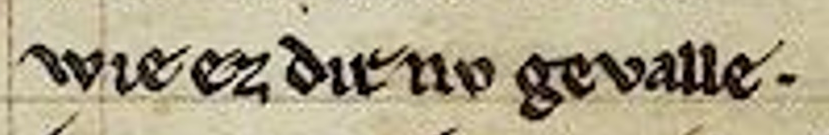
Wie ez dir nv gevalle.
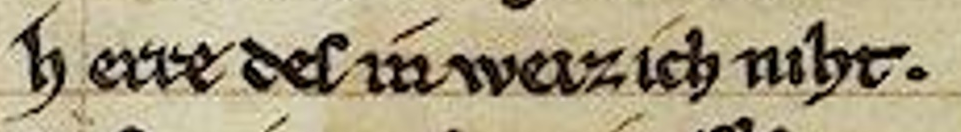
Herre deſ in weiz ich niht.
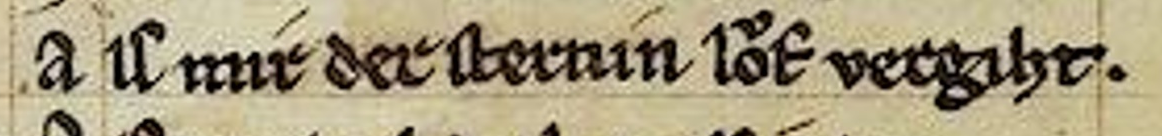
Alſ mir der ſternin lo°vf vergiht.
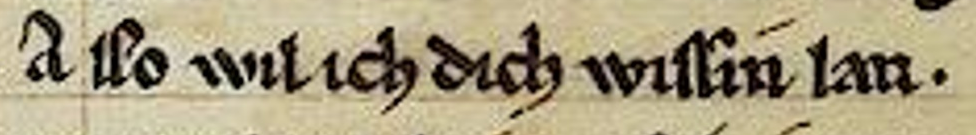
Alſo wil ich dich wiſſin lan.
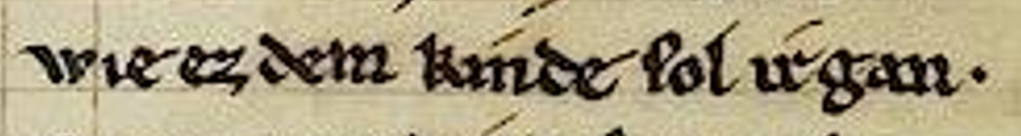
Wie ez dem kinde ſol irgan.
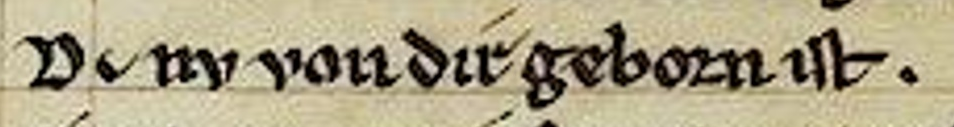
D(az) nv von dir geborn iſt.
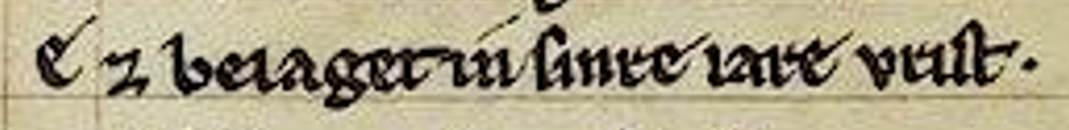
Ez beiaget in ſinre iare vriſt.
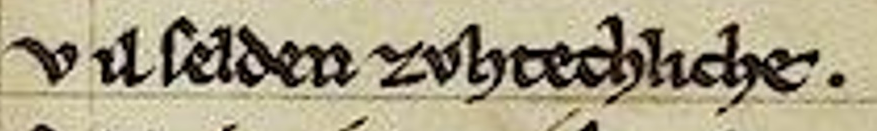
Vil ſelden zvhtechliche.
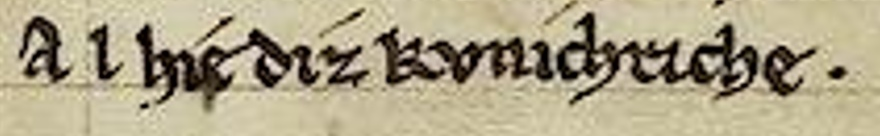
Al hie diz kvnichriche.
